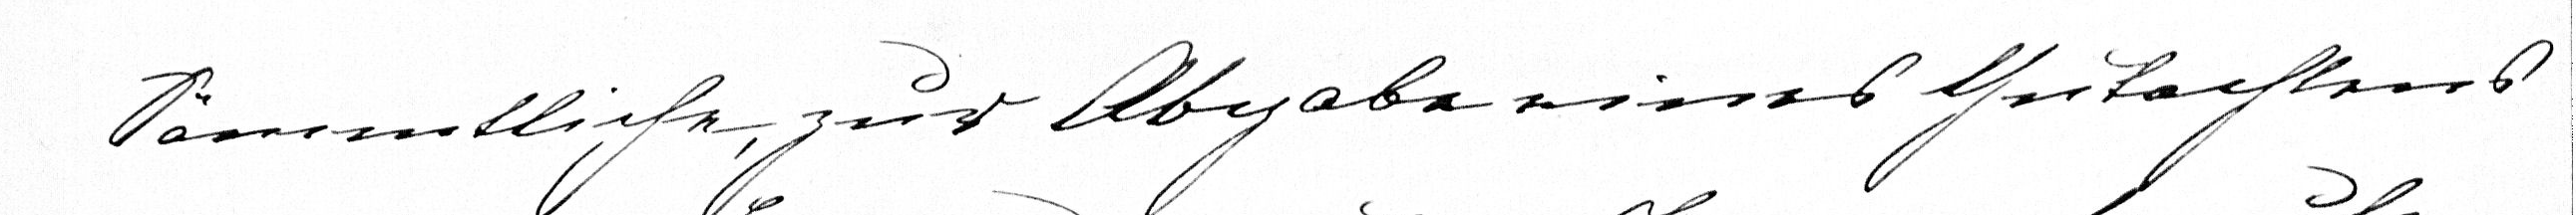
Sämmtliche, zur Abgabe eines Gutachtens
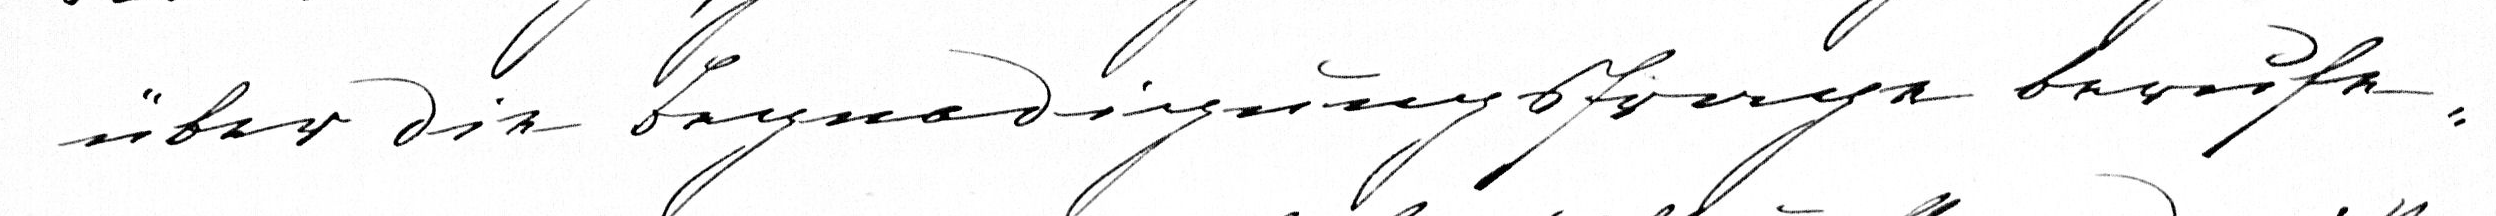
über die Begnadigungsfrage berufe¬
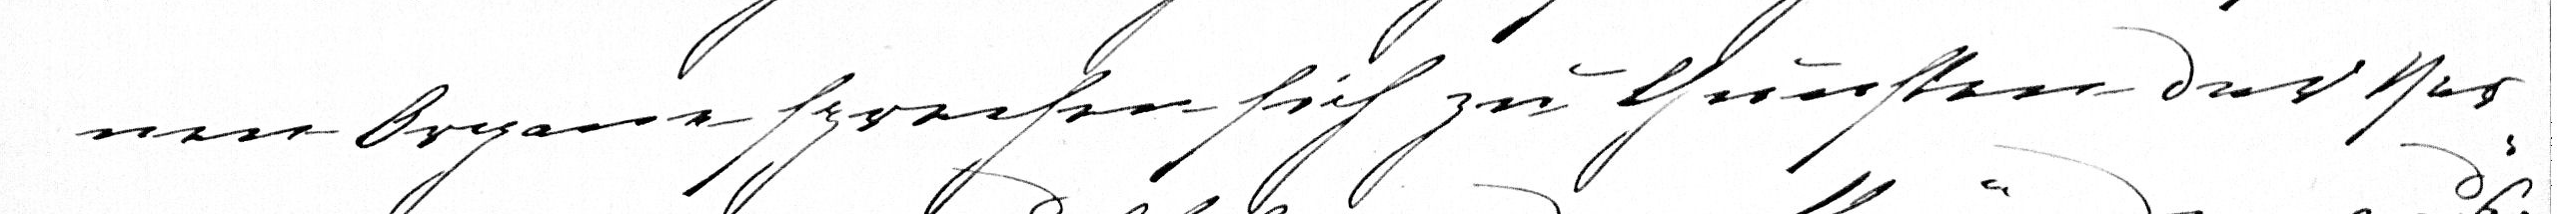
nen Organe sprechen sich zu Gunsten der Ver¬
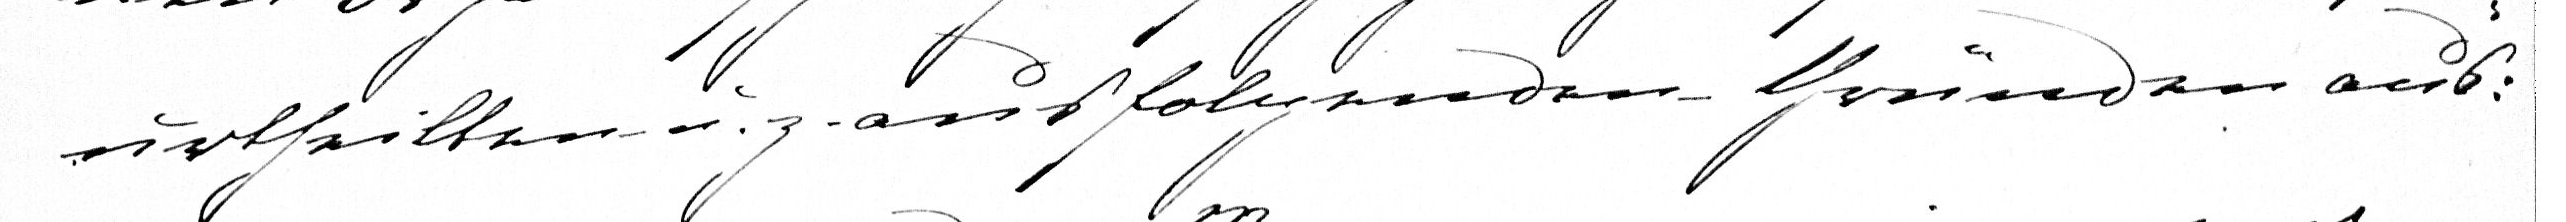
urtheilten u. z. aus folgenden Gründen aus:
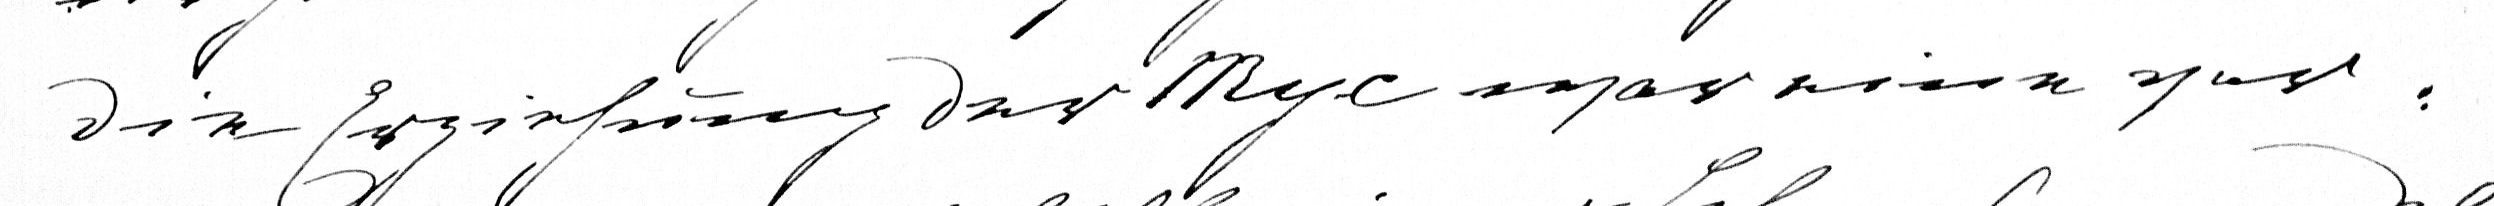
Die Erziehung der Myc war eine vor¬
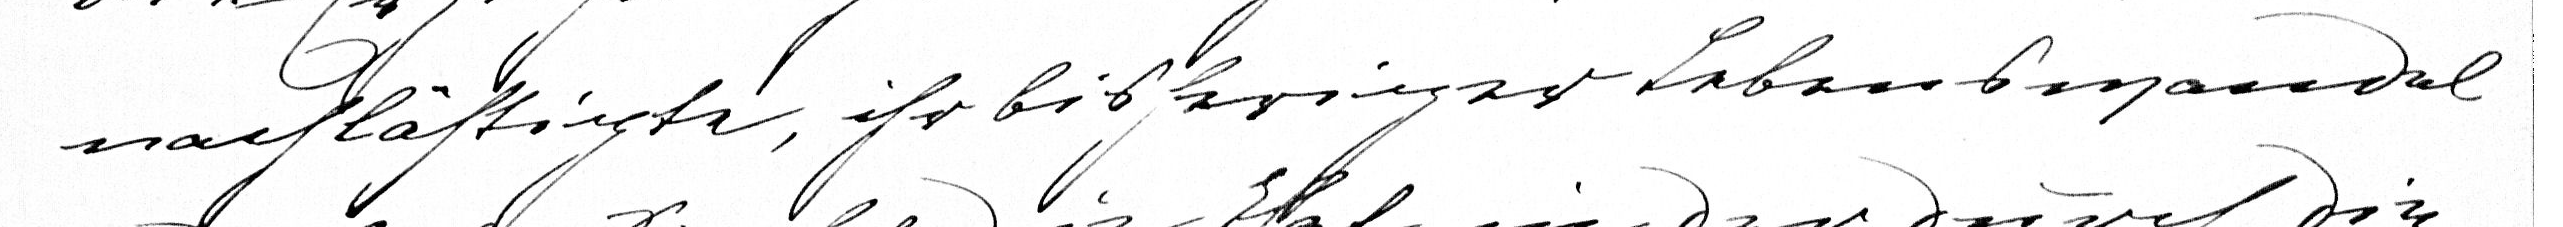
nachlästigte, ihr bisheriger Lebenswandel
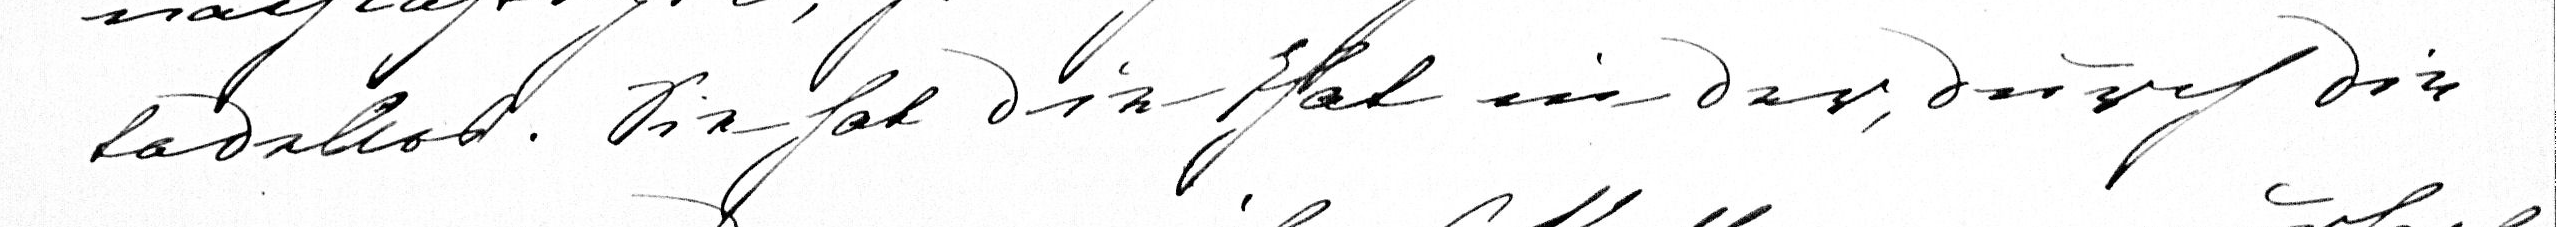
todelxx. Sie hat die That in der, durch die
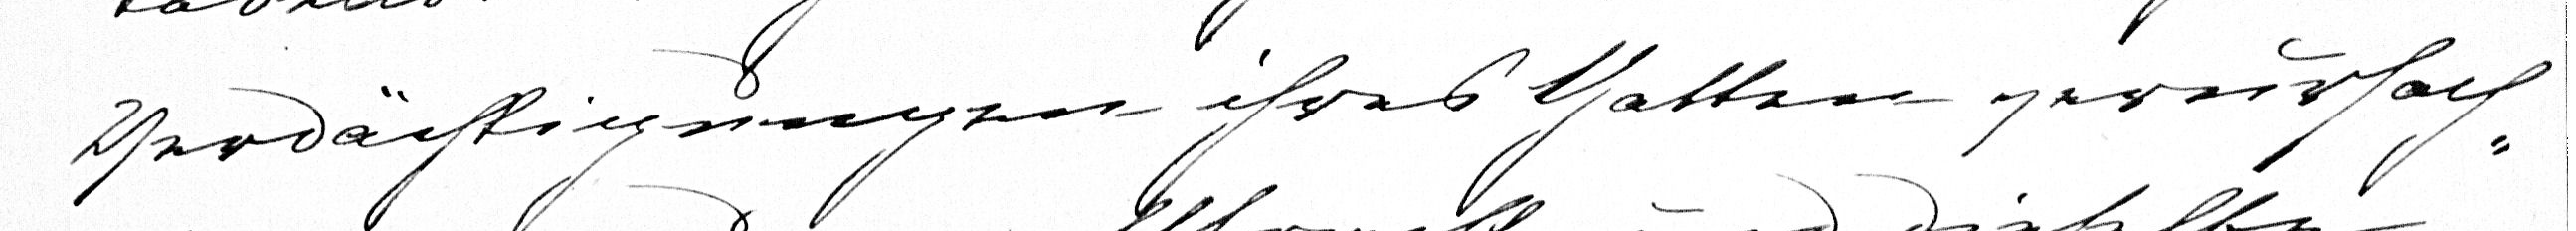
Verdächtigungen ihres Gatten verursach¬
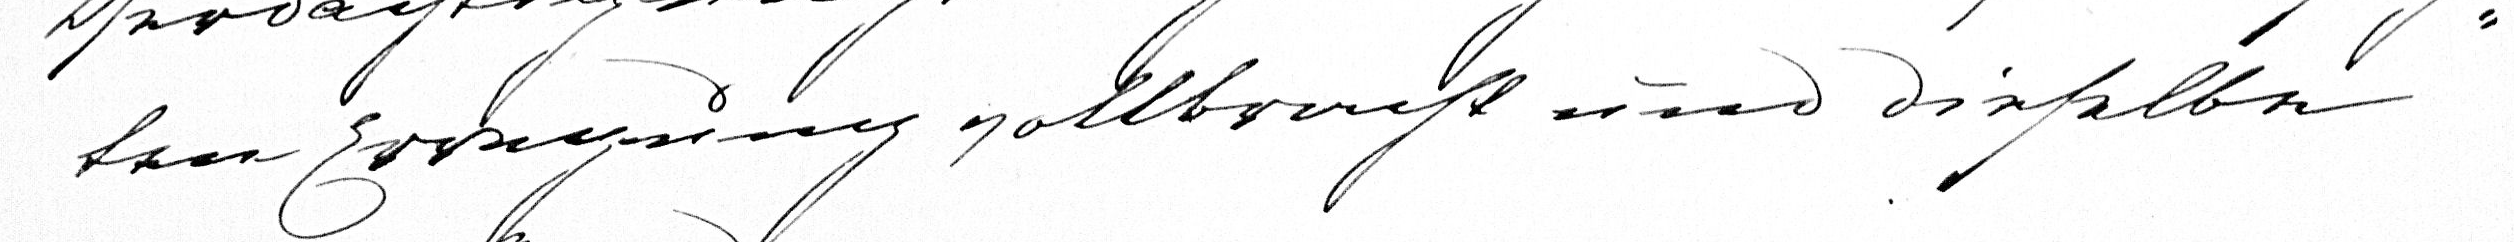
ten Erregung vollbracht und dieselbe
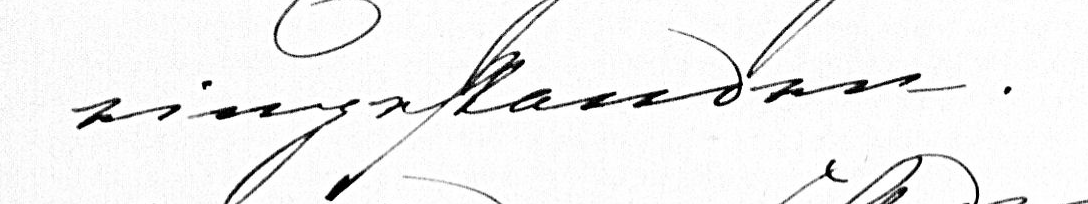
eingestanden.
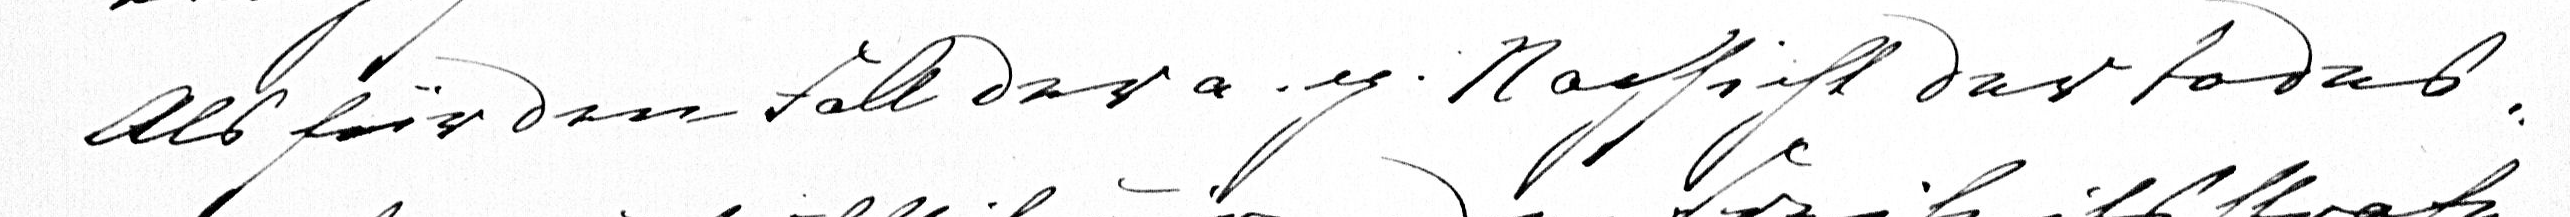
Als für den Fall der a. g. Nachsicht der Todes¬
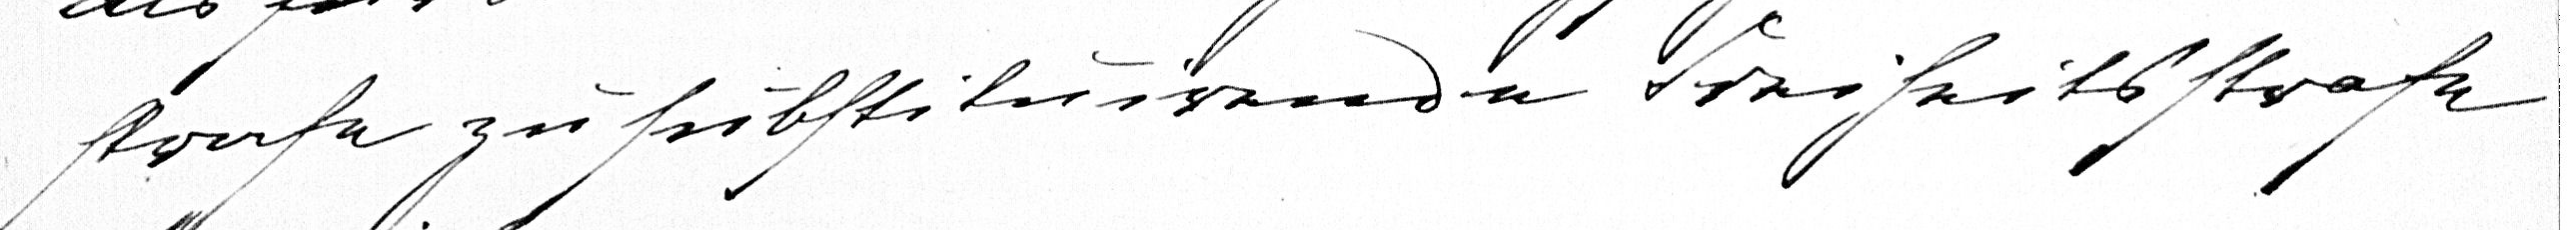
strafe zu subsituirende Freiheitsstrafe
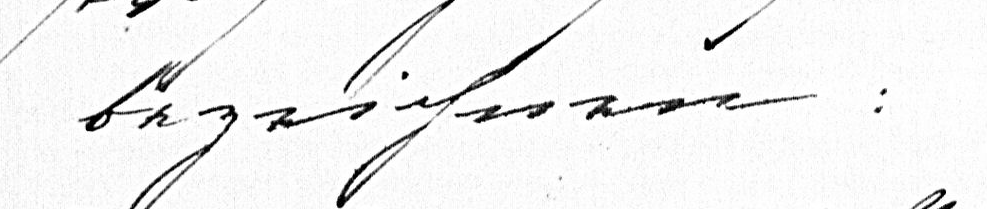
bezeichnen:
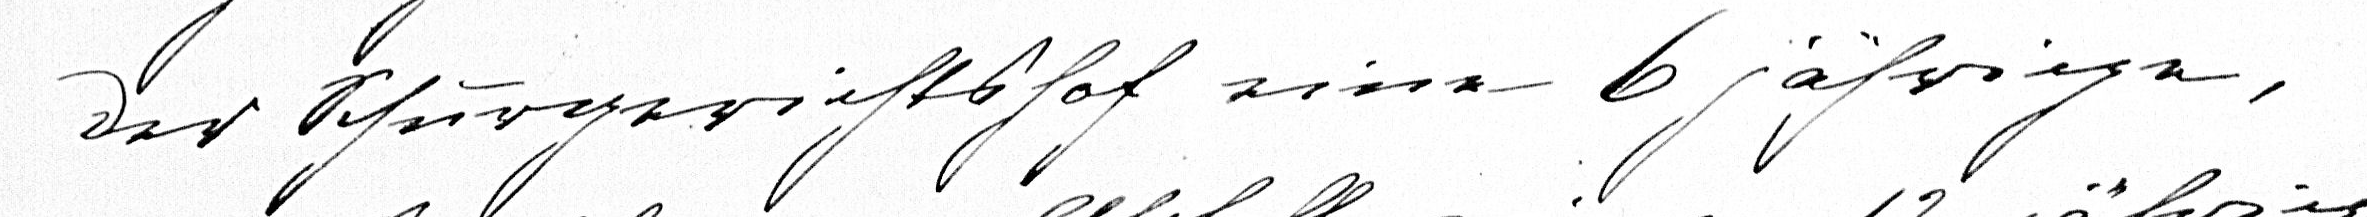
Der Schurgerichtshof eine 6 jährige,
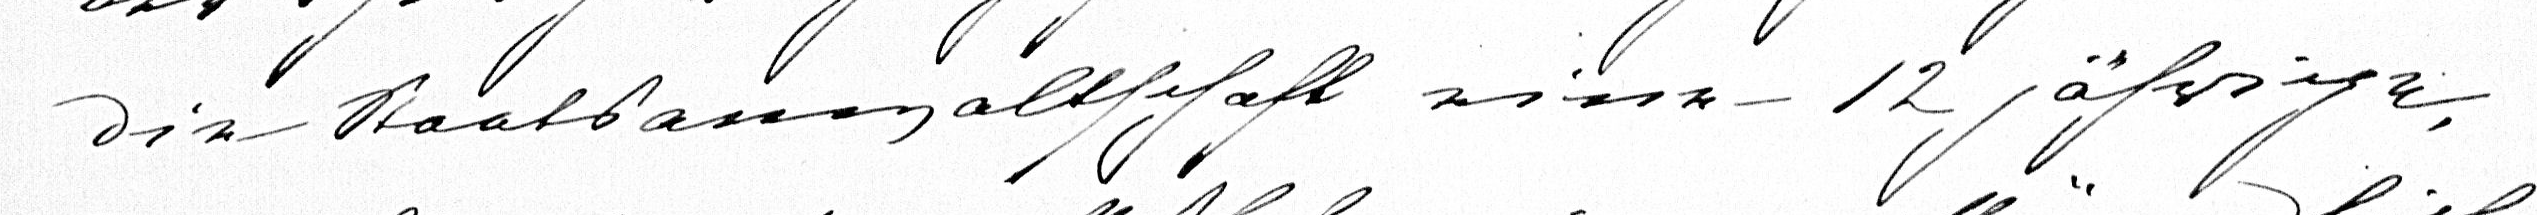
die Staatsanwaltschaft eine 12jährige,
